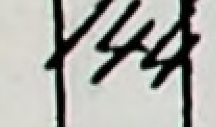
144
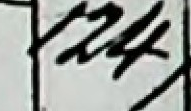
124
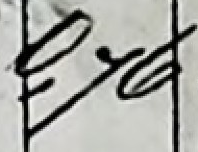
0,76
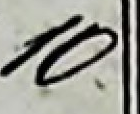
10
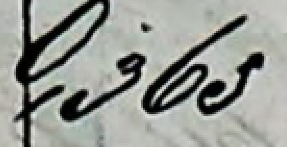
0,365
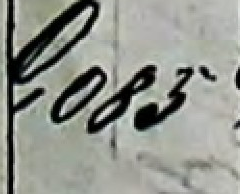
0,085
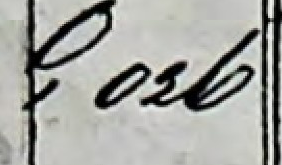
0,026
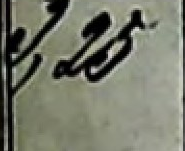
3,25
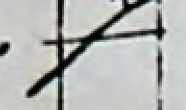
7
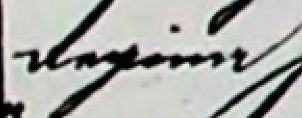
Regina
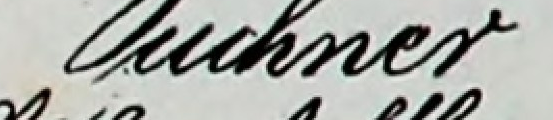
Puchner
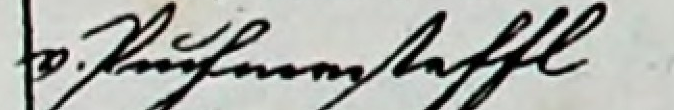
v. Puchnensteffl
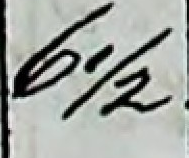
6 1/2
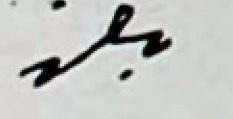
Do
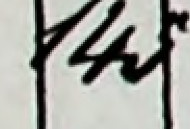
145
